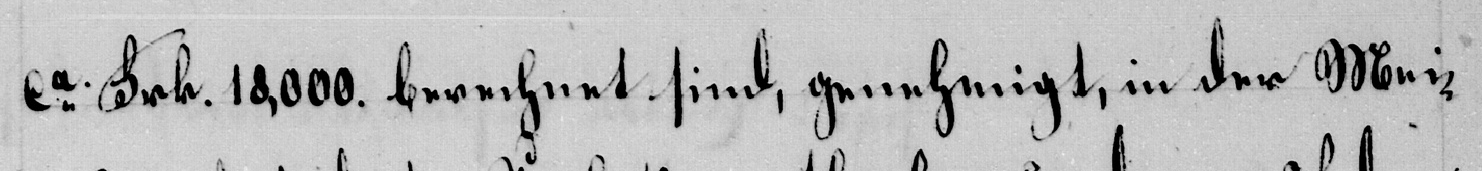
ca. Frk. 18,000. berechnet sind, genehmigt, in der Mei¬
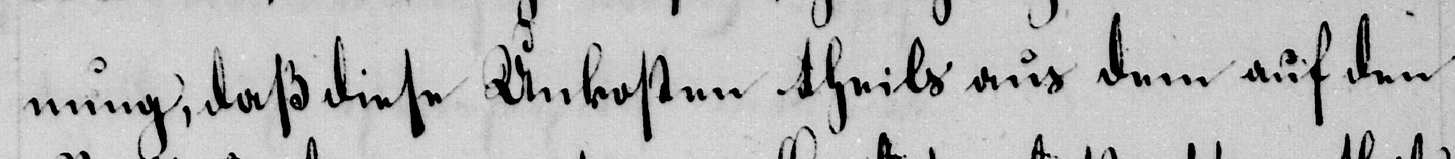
nung, daß diese Unkosten theils aus dem auf den
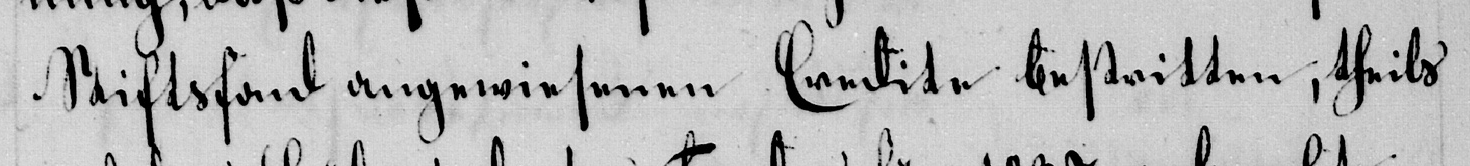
Stiftsfond angewiesenen Credite bestritten, theils
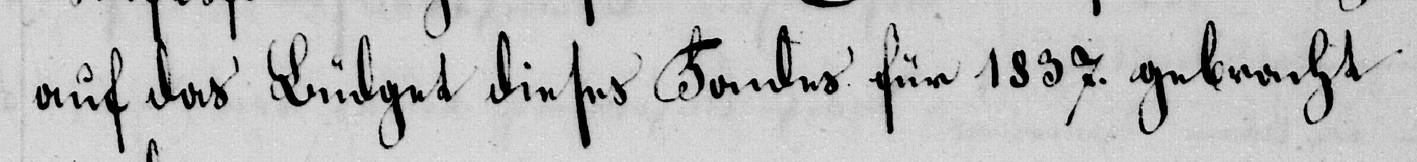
auf das Büdget dieses Fondes für 1837. gebracht
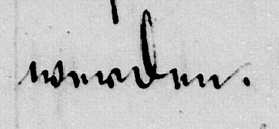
werden.
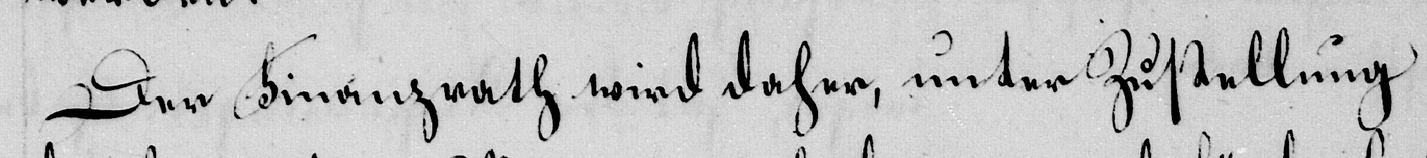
Der Finanzrath wird daher, unter Zustellung
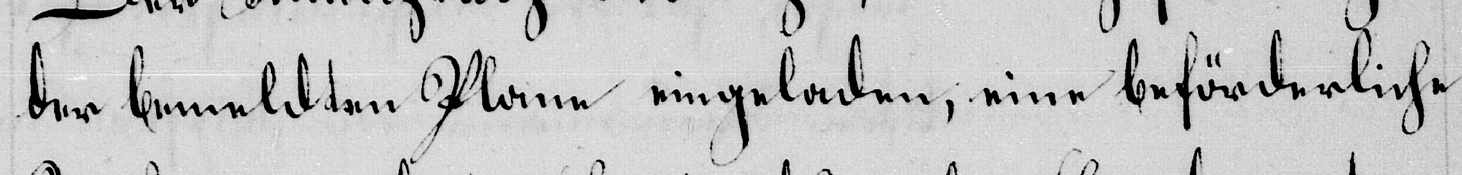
der bemeldeten Plane eingeladen, eine beförderliche
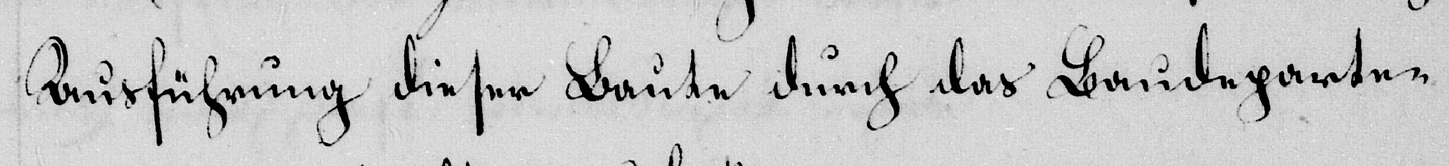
Ausführung dieser Baute durch das Baudeparte¬
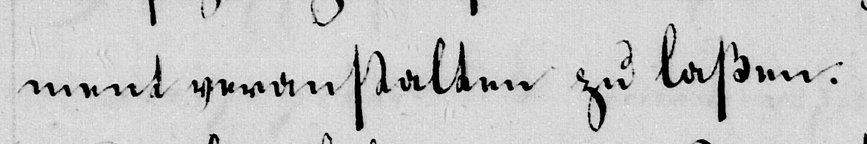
ment veranstalten zu laßen.
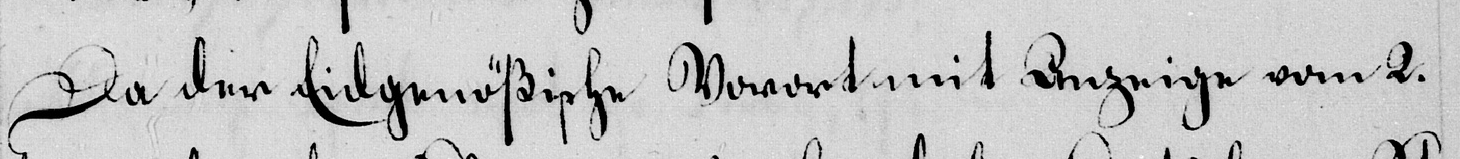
Da der Eidgenößische Vorort mit Anzeige vom 2.
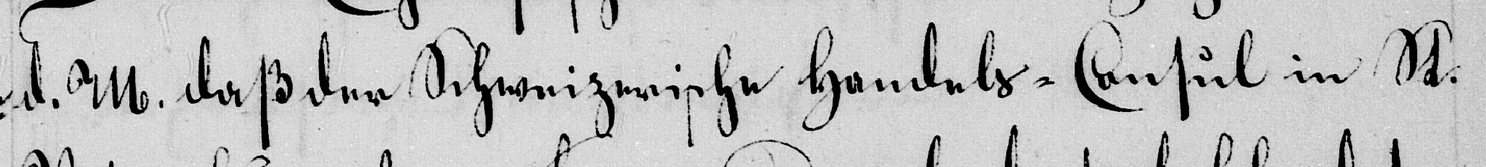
d. M. daß der Schweizerische Handels-Consul in St.
